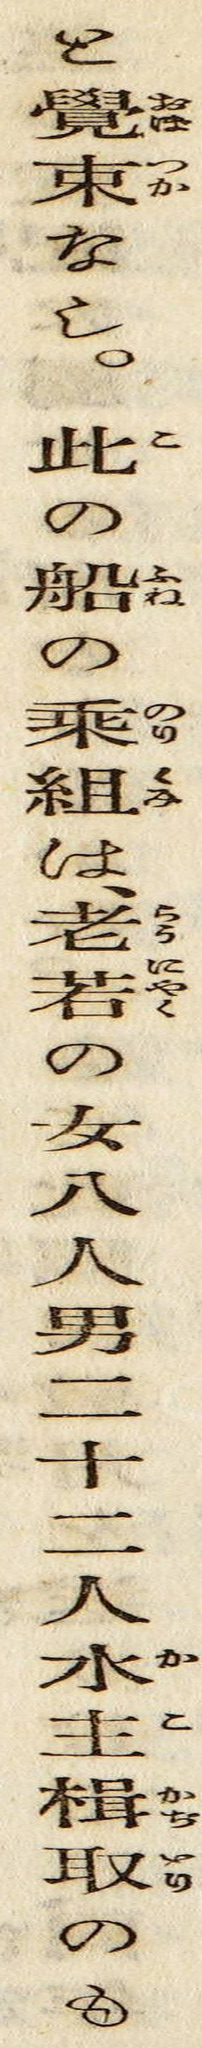と覚束なし。此の船の乗組は、老若の女八人男二十二人水主楫取のも
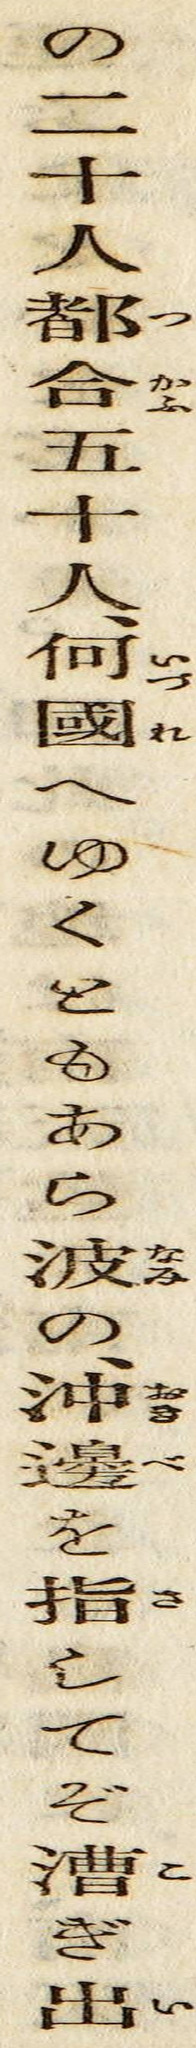の二十人都合五十人、何国へゆくともあら波の、沖辺を指してぞ漕ぎ出
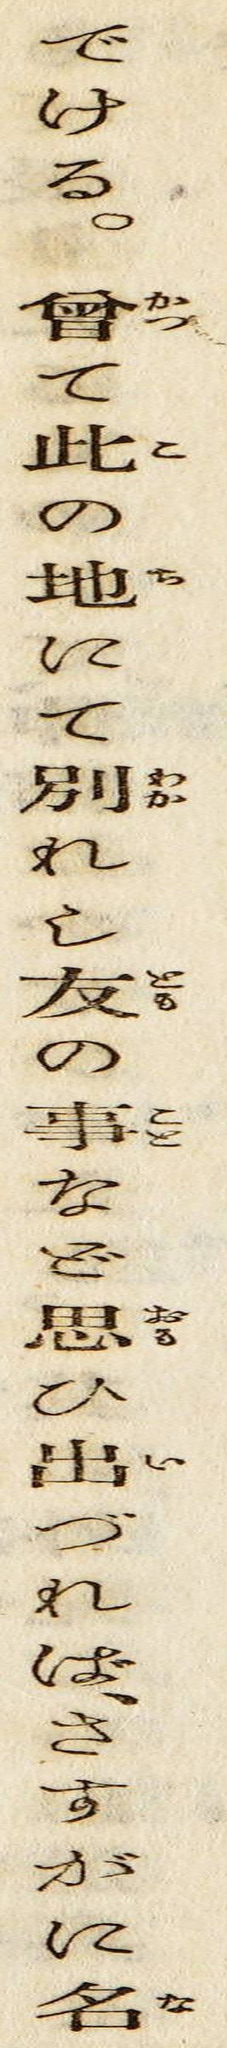でける。曽て此の地にて別れし友の事など思ひ出づれば、さすがに名
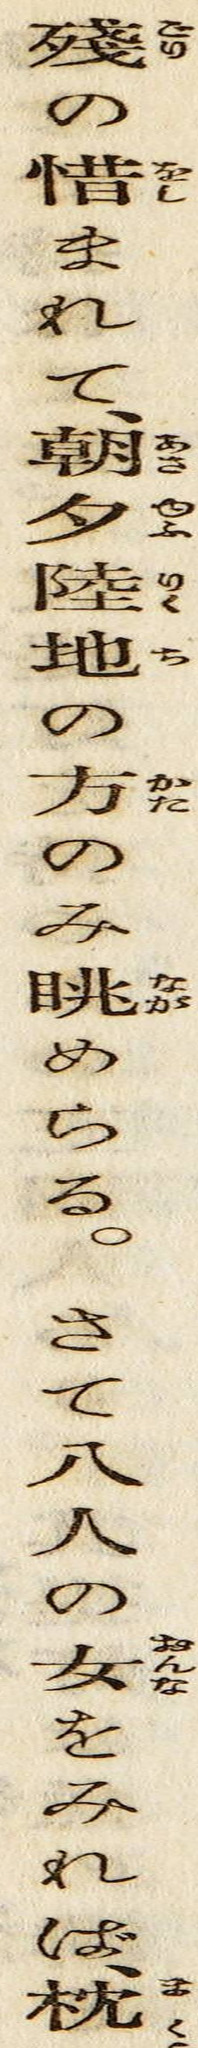残の惜まれて、朝夕陸地の方のみ眺めらる。さて八人の女をみれば、枕
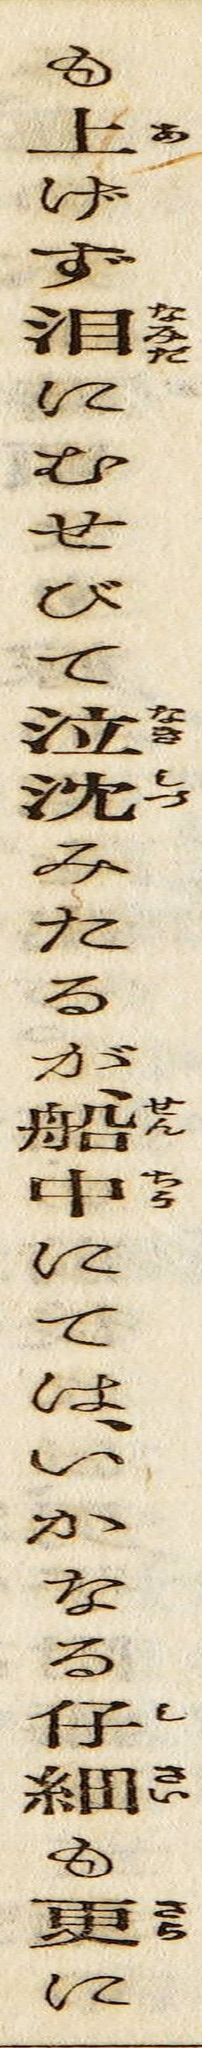も上げず泪にむせびて泣沈みたれるが、船中にては、いかなる仔細も更に
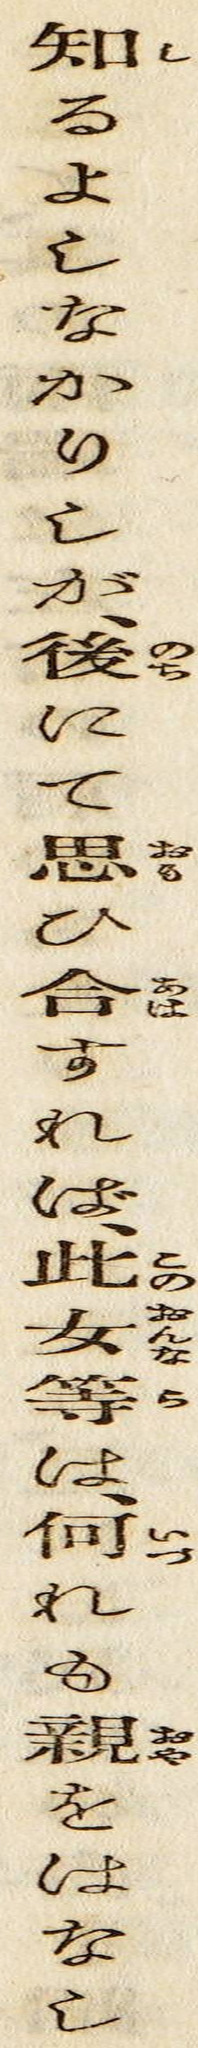知るよしなかりしが、後にて思ひ合すれば、此女等は、何れも親をはなし
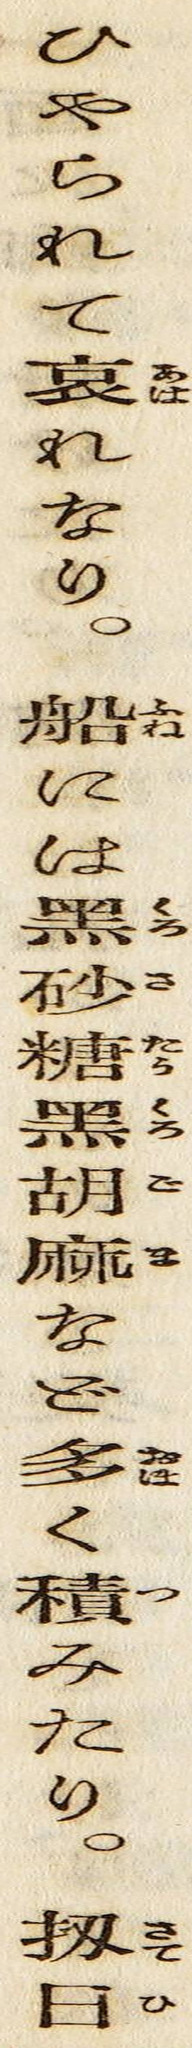ひやられて哀れなり。船には黒砂糖黒胡麻など多く積みたり。扨日
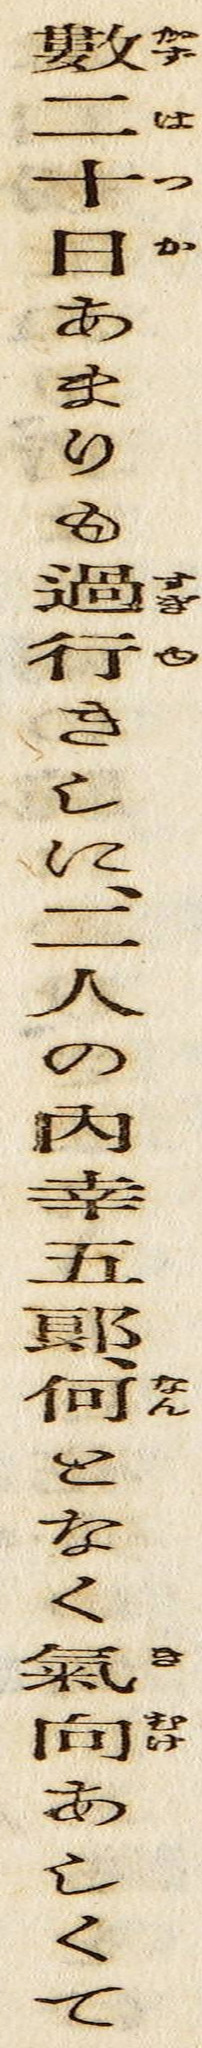数二十日あまりも過行きしに、二人の内幸五郎、何となく気向あしくて
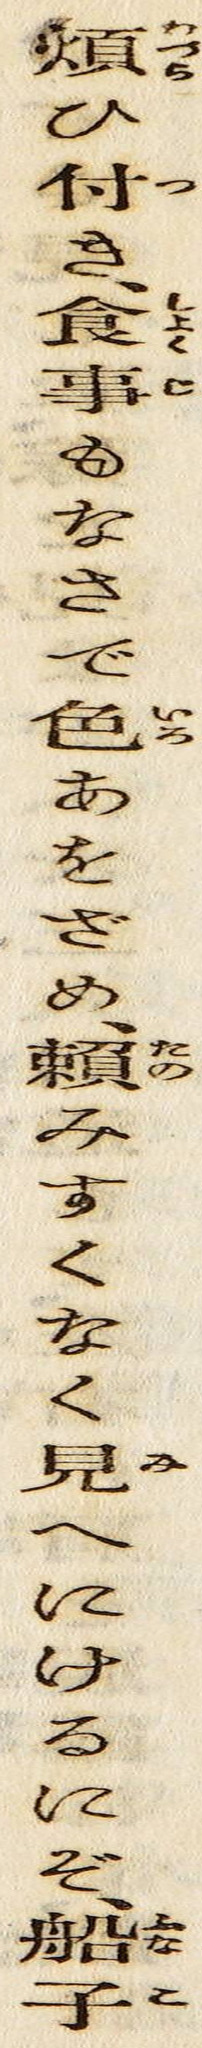煩ひ付き、食事もなさで色あをざめ、頼みすくなく見へにけるにぞ、船子
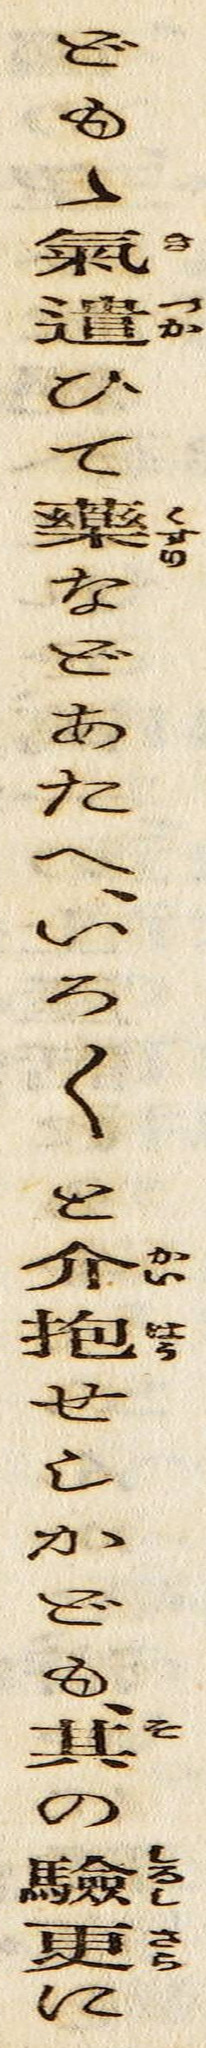どもゝ気遣ひて薬などあたへ、いろ〳〵と介抱せしかども、其の験更に
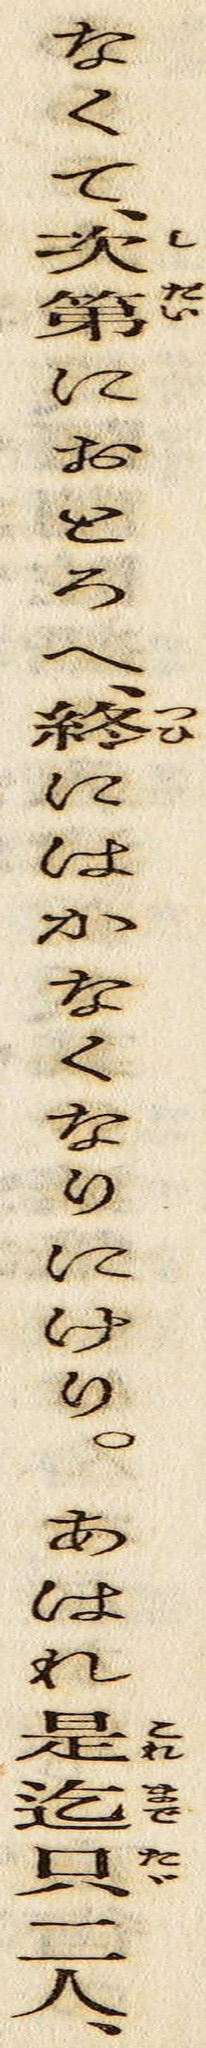なくて、次第におとろへ、終にはかなくなりにけり。あはれ是迄只二人、
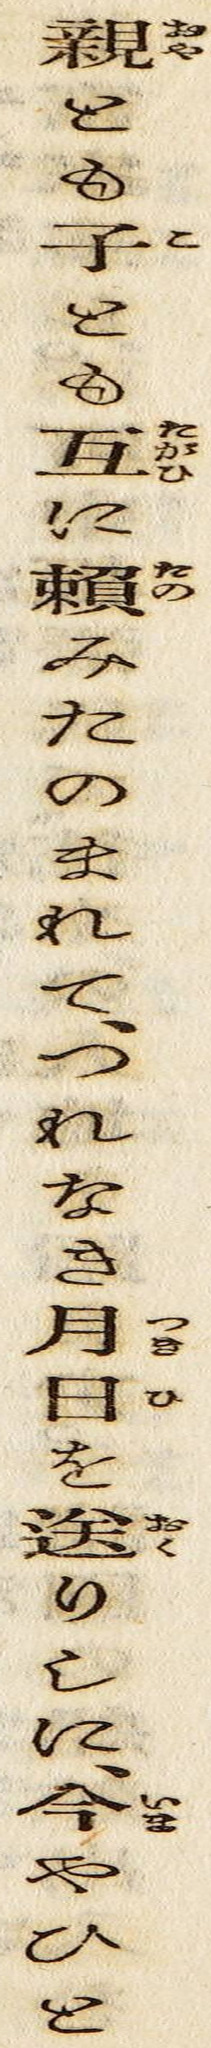親とも子とも互に頼みたのまれて、つれなき月日を送りしに、今やひと
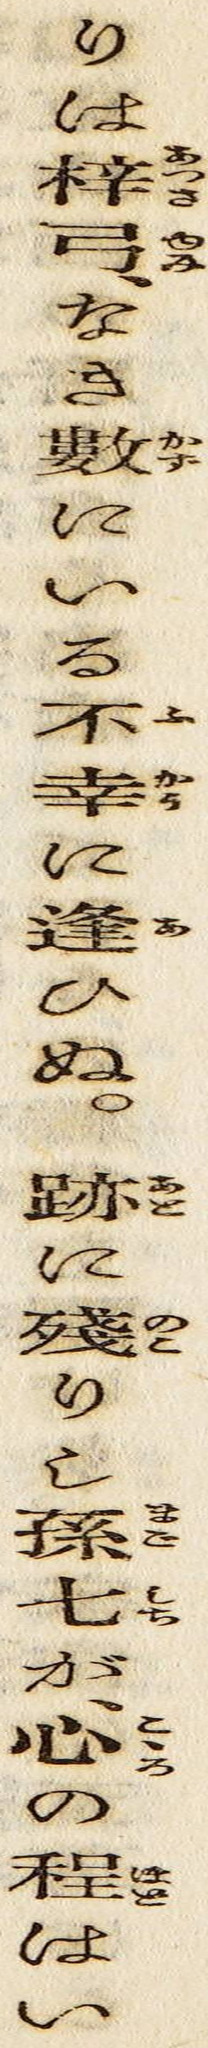りは梓弓、なき数にいる不幸に逢ひぬ。跡に残りし孫七が、心の程はい
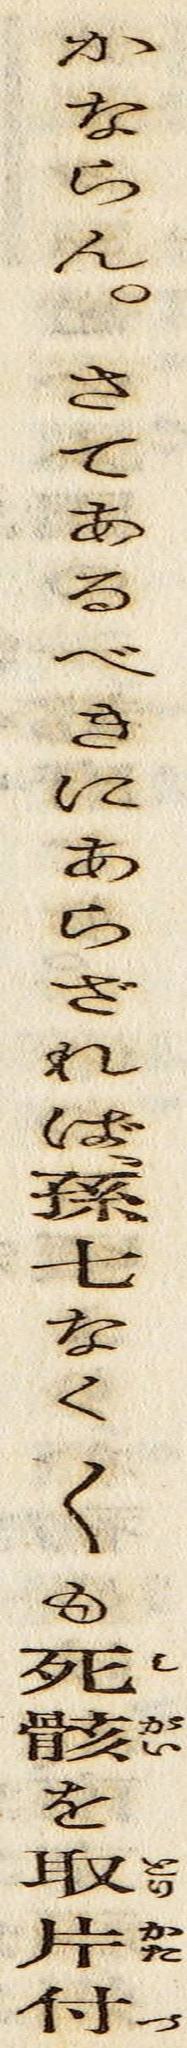かならん。さてあるべきにあらざれば、孫七なく〳〵も死骸を取片付
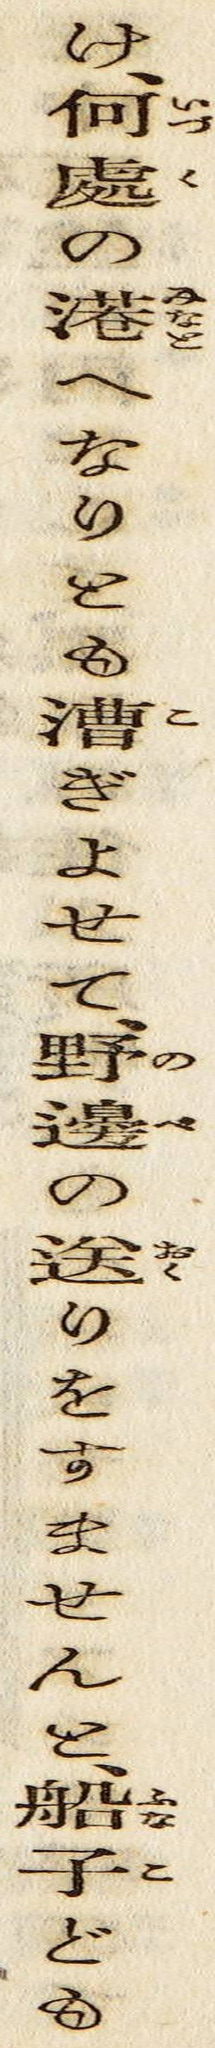け、何処の港へなりとも漕ぎよせて、野辺の送りをすませんと、船子ども
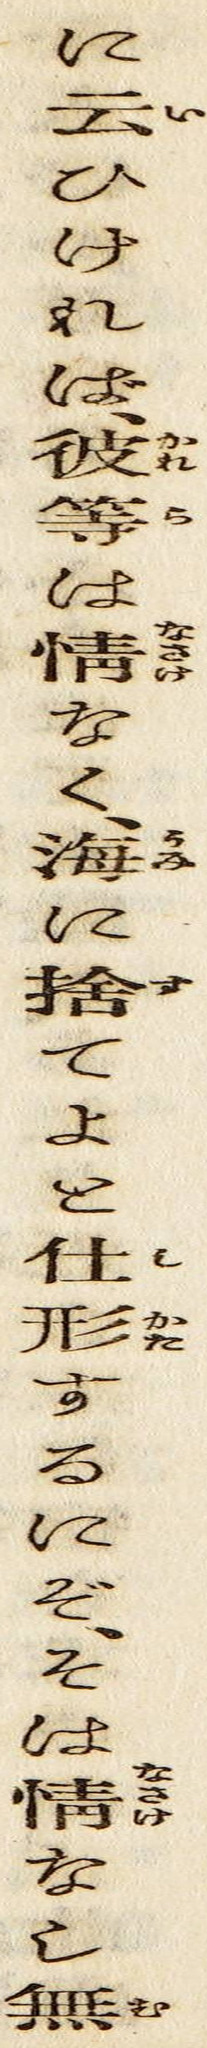に云ひければ、彼等は情なく、海に捨てよと仕形するにぞ、そは情なし無
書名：日本漂流譚
